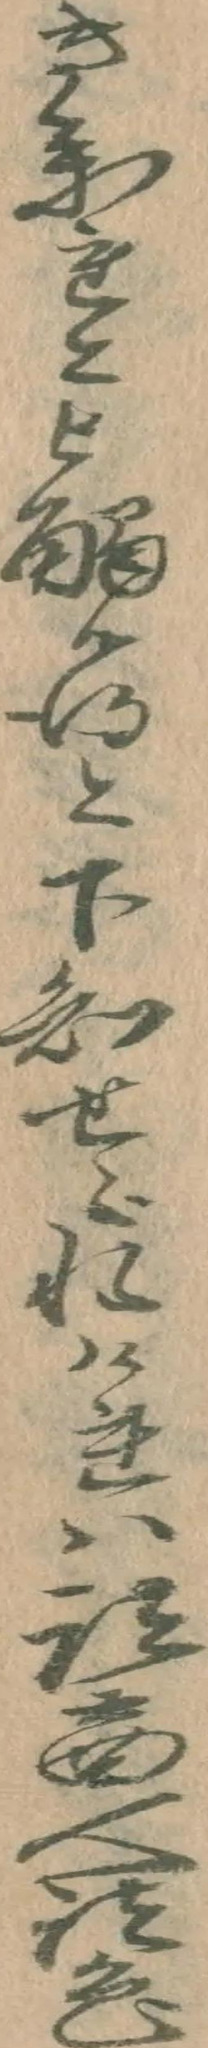き参連と被觸候得と下知せられけ連は諸商人諸色
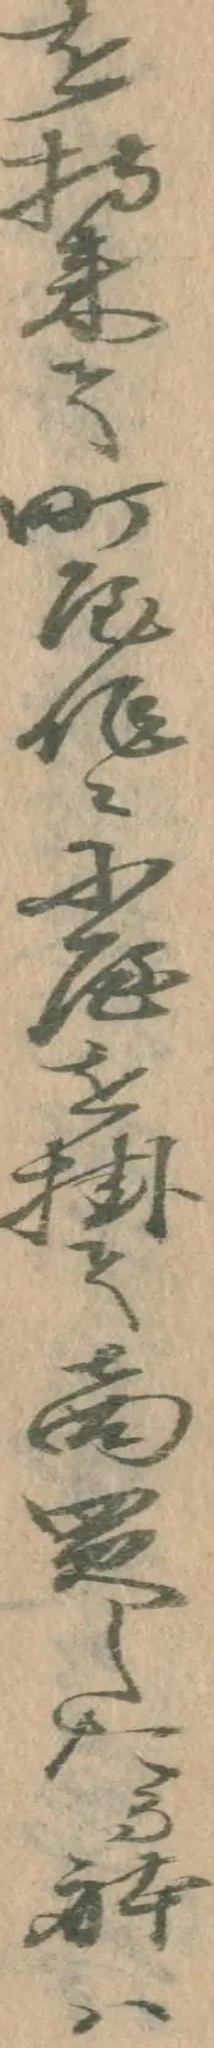を持参て町屋作に小屋を掛て商買したる躰は
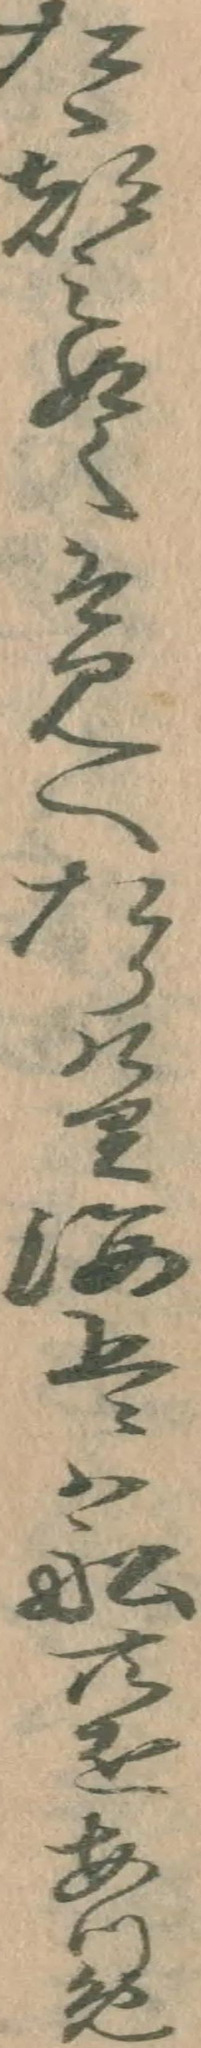たつ都之如く今見へたりけ里海上には舩共をあ川免
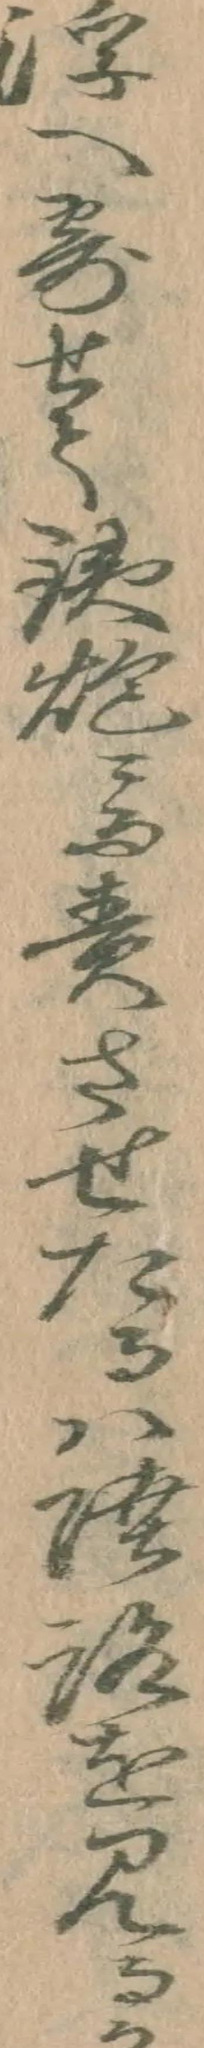浮へ寄せて鉄砲に而責させたるは陸路を見るか
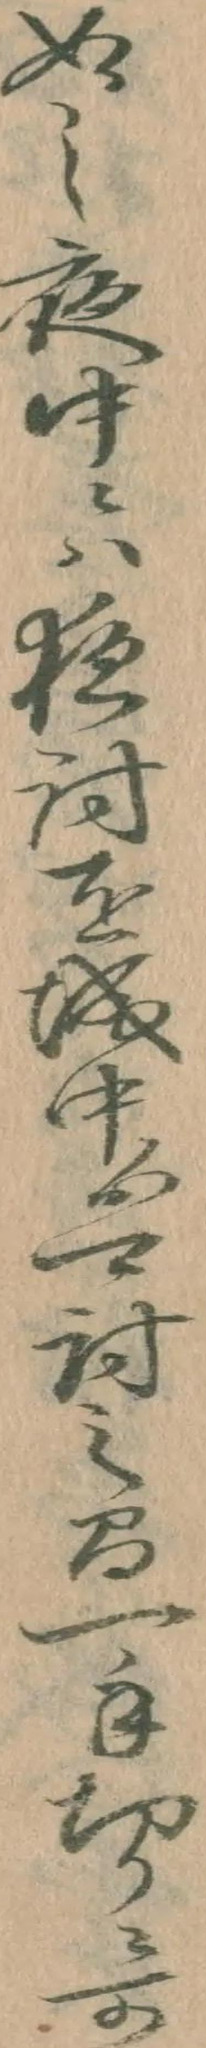如し夜中には夜討を城中ゟ可討之間一手切りに可
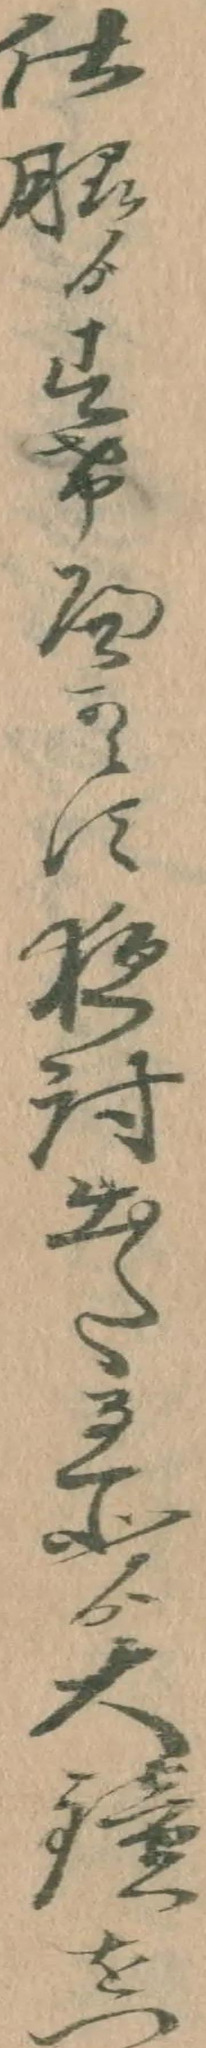仕脇ゟ春希扁可ら須夜討出たる所ゟ大鐘をつ
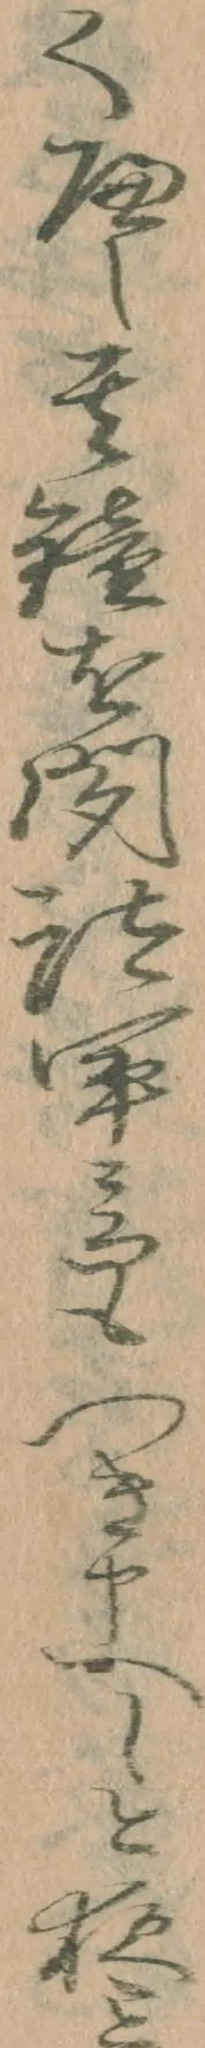く扁し其鐘を聞諸軍に而もつき申へしと夜と
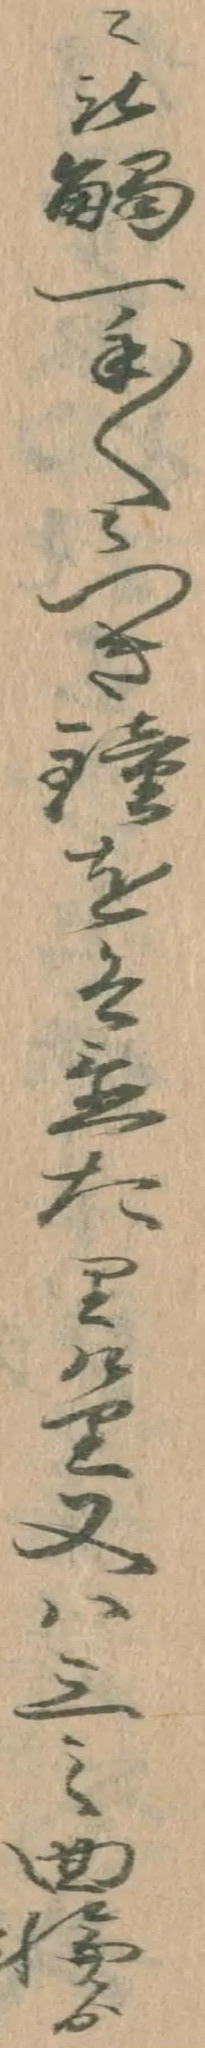に被觸一手〱につき鐘を今置た里け里又は三之曲輪ゟ
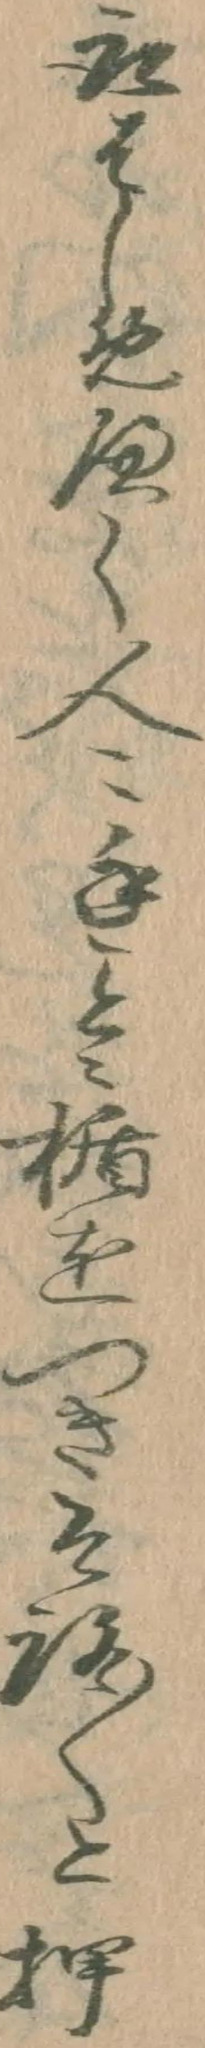取はし免扁し人に手とに楯をつきそ路〳〵と押
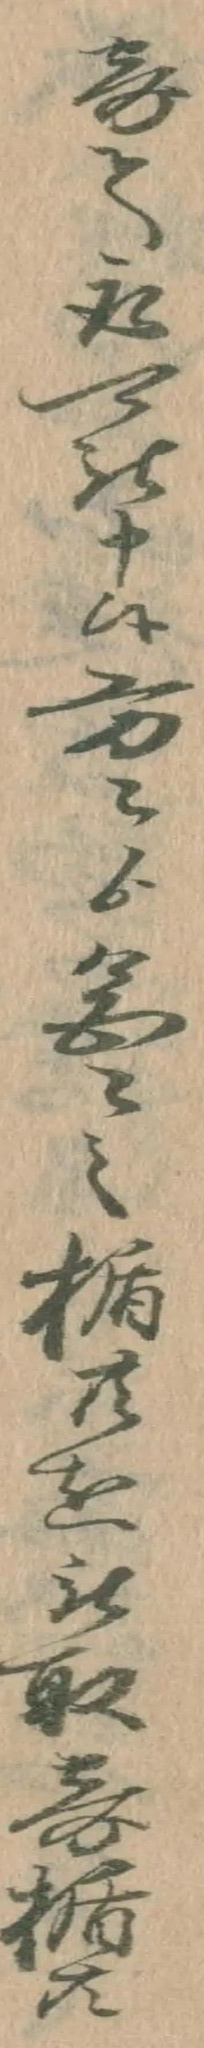寄て取可被申候方々ゟ色々之楯共を被取寄楯共
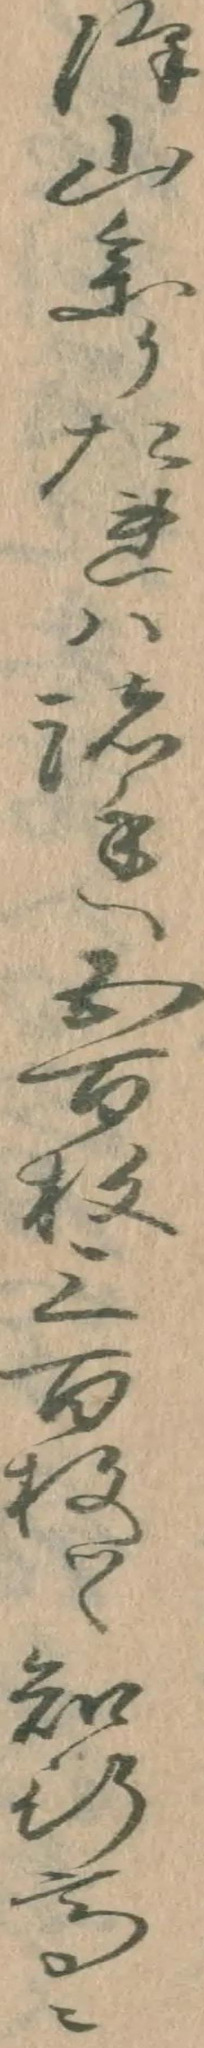沢山参りた連は諸手へ五百枚三百枚つゝ知行高に
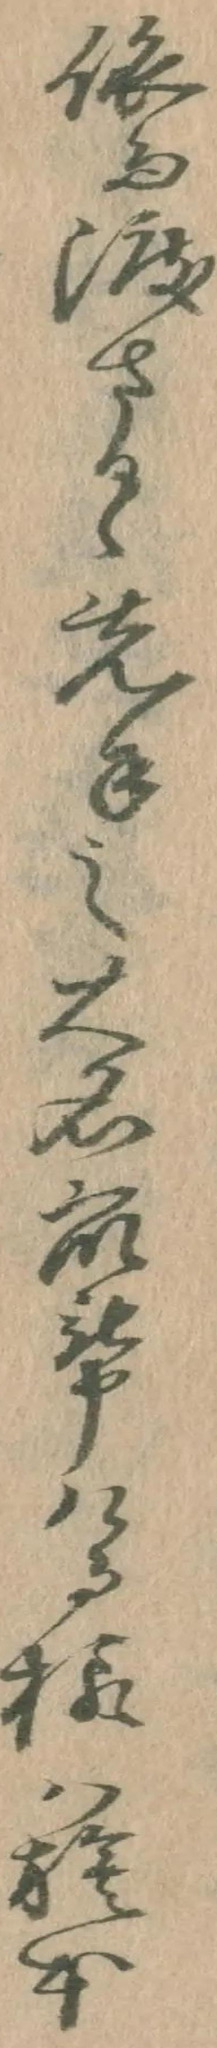依而渡さるゝ先手之大名衆被申ける様は旗本
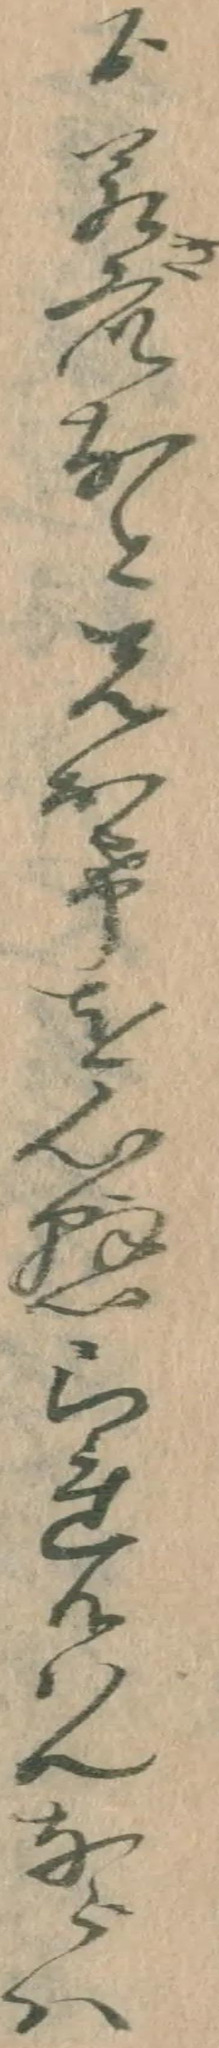ゟ若き衆なと先加希を心懸ら連候はんならは
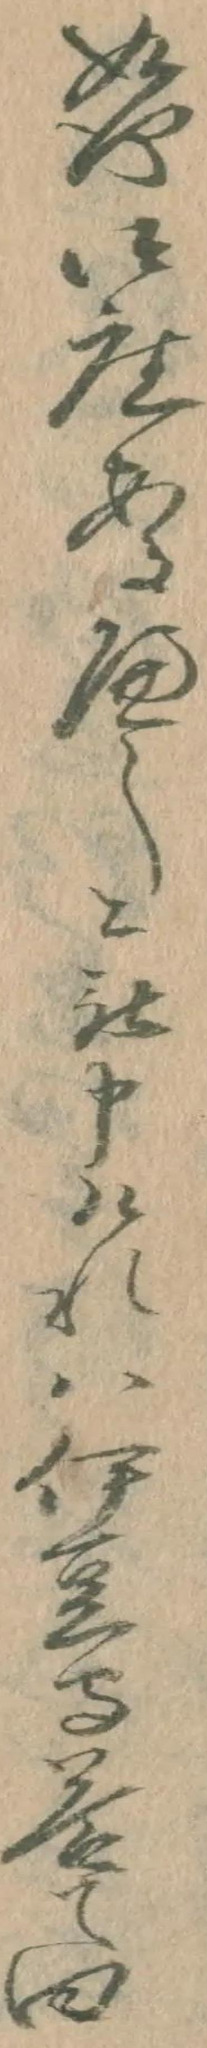如何御座ある扁しと被申けれは伊豆守答て曰
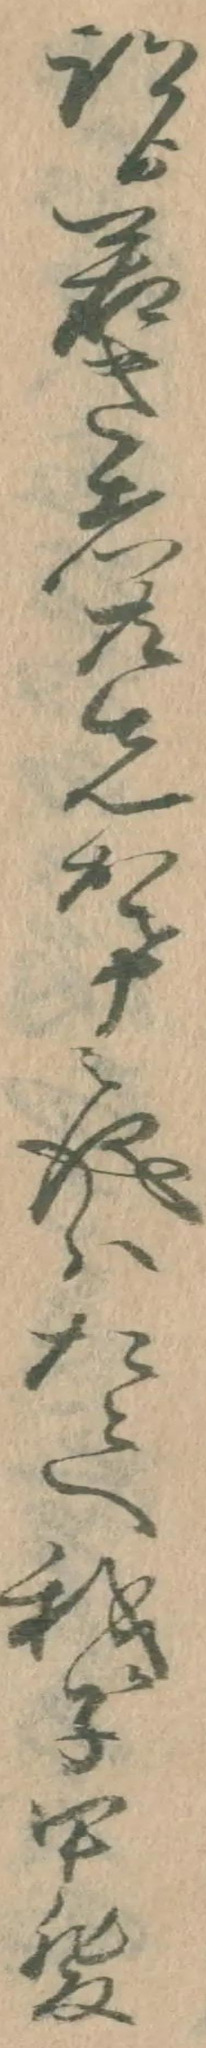跡ゟ若き者共先加希之儀はたとへ我子甲斐
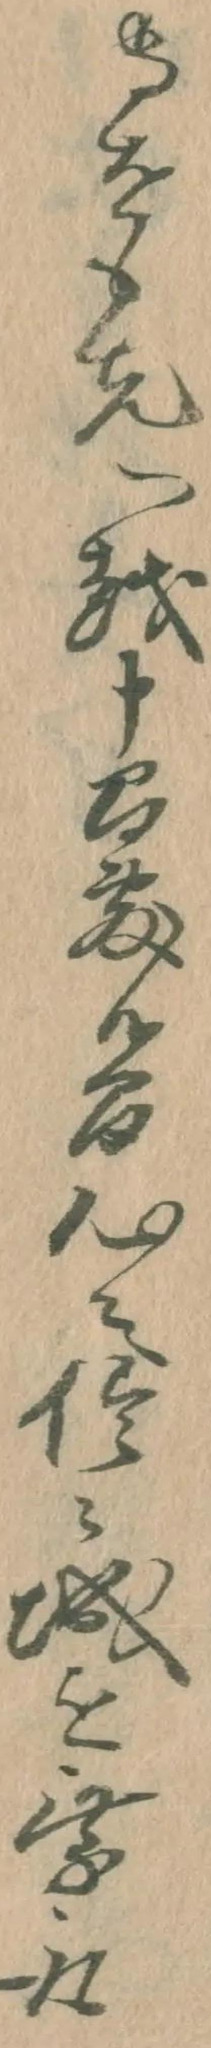守をも先へ越申間敷候間心之侭に城を乗取
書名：切支丹御退治記 49巻. [5]
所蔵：国立国会図書館 National Diet Library, JAPAN
